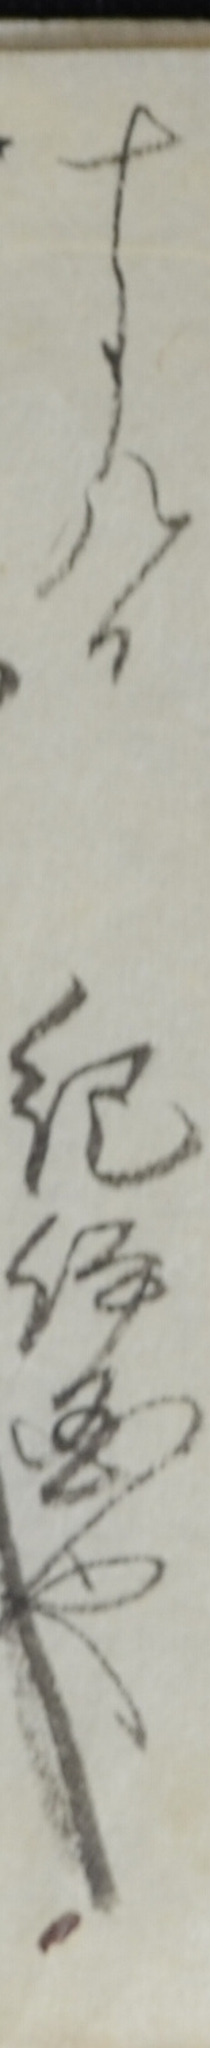十月八日紀伊国屋
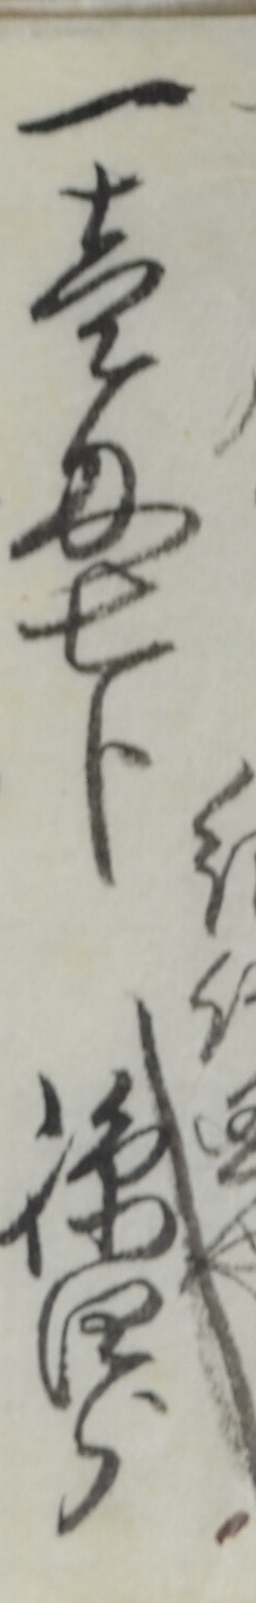一壱匁七分孫四郎
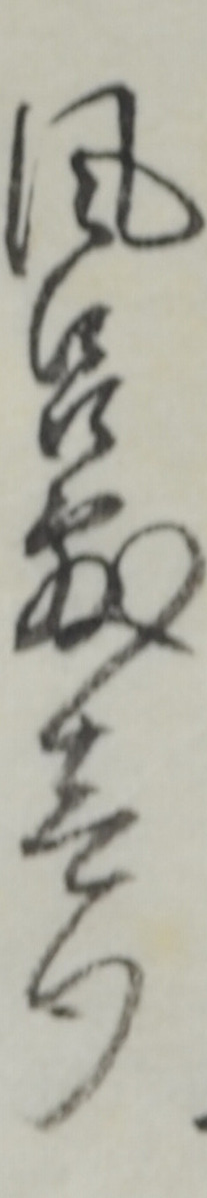風呂敷壱ツ
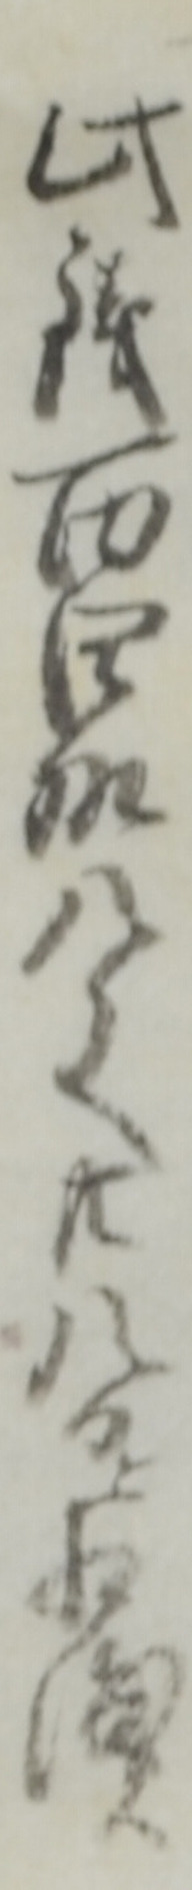此銭百四拾八文廿八日ニ相渡ス
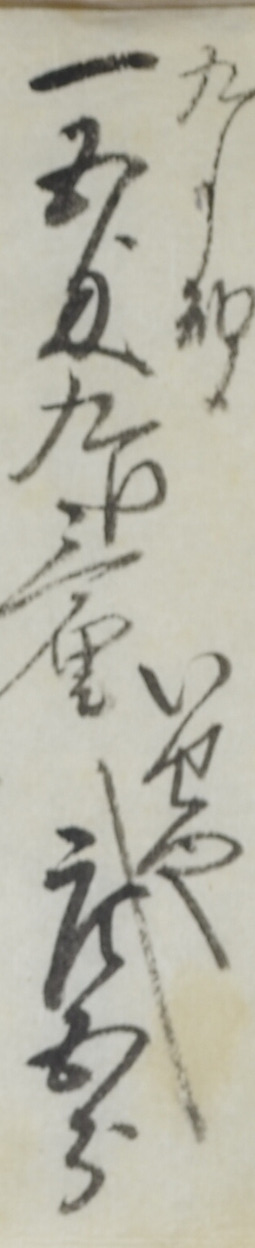一五匁九分三厘庄五郎
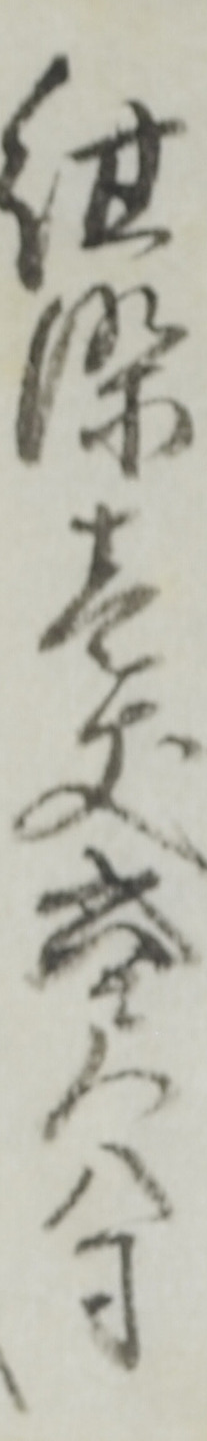紺染壱丈六尺八寸
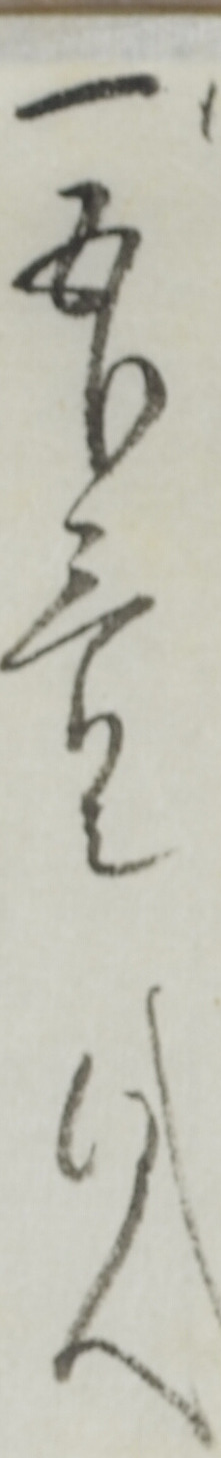一五分三りん同人
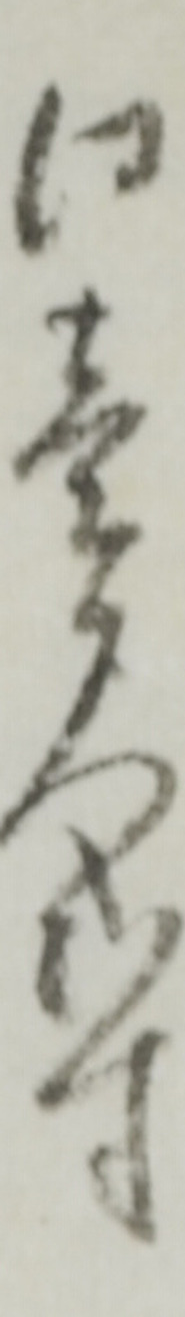同壱尺弐寸
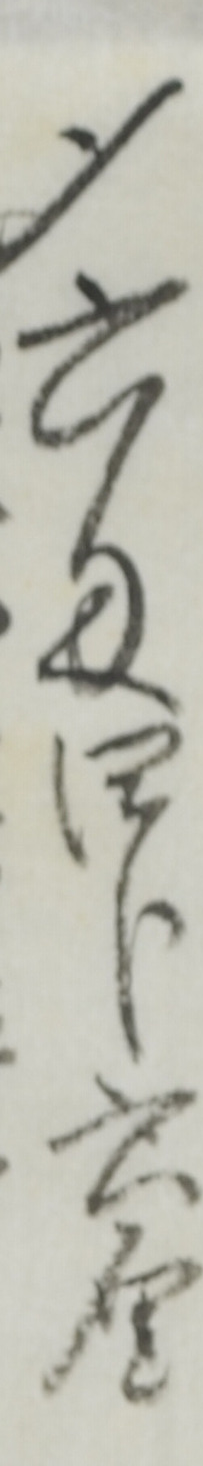〆六匁四分六厘
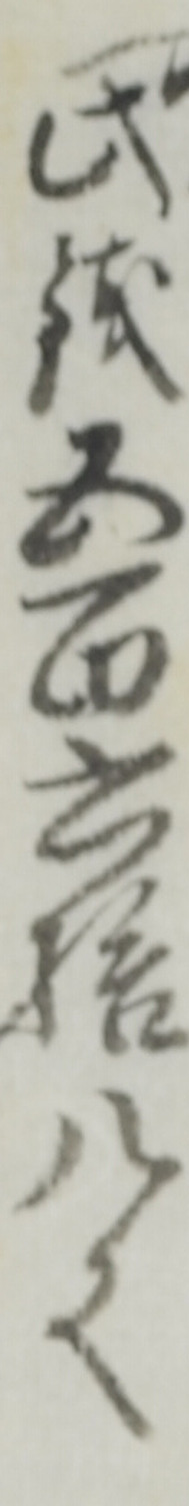此銭五百六拾八文
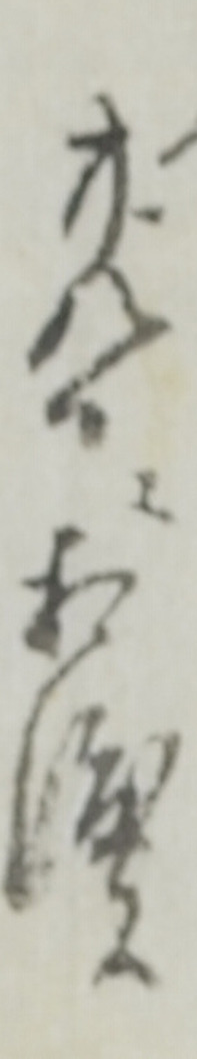廿八日ニ相渡ス
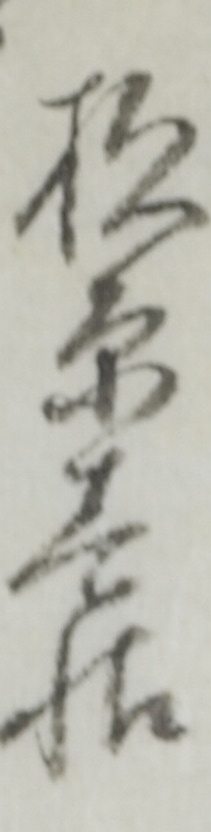杉原壱帖
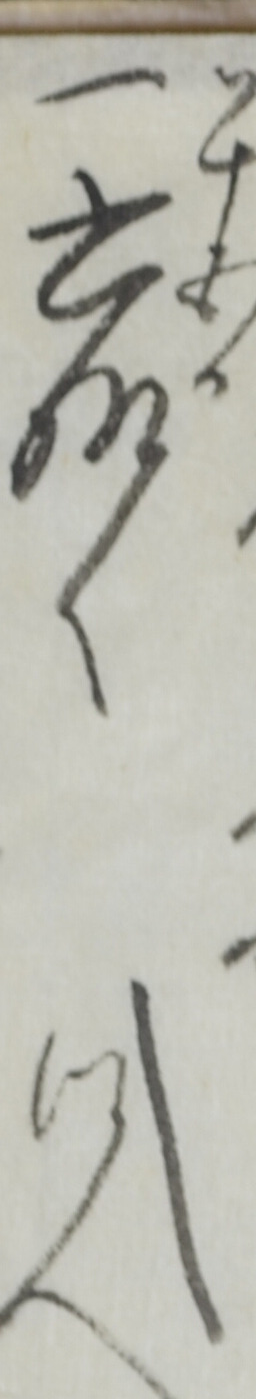一六拾文同人
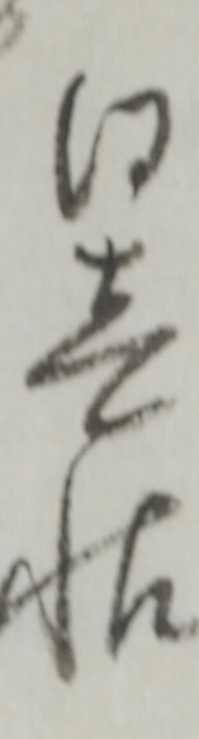同壱帖
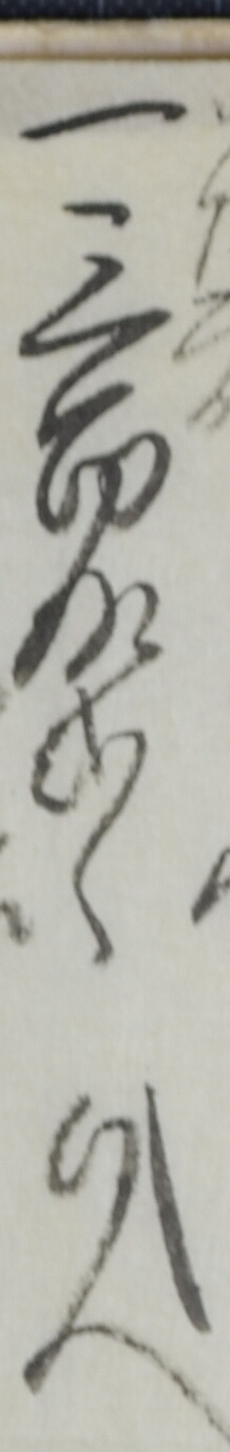一三百拾弐文同人
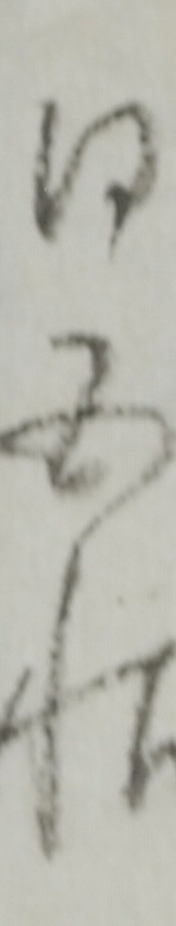同五帖
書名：権現勧化入用勘定帳
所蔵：伊那市立高遠町図書館・合同会社AMANE
